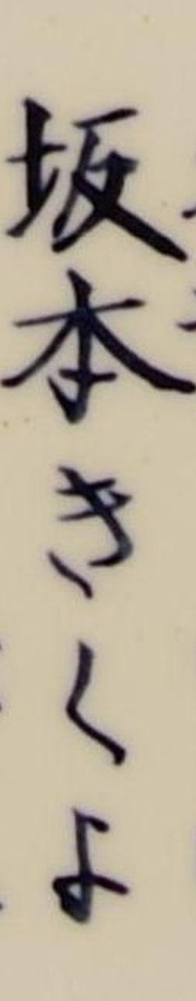坂本きくよ
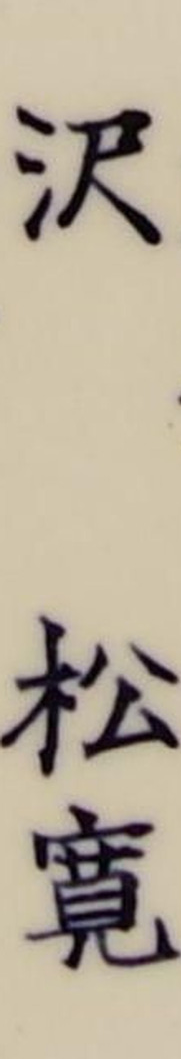沢松寛
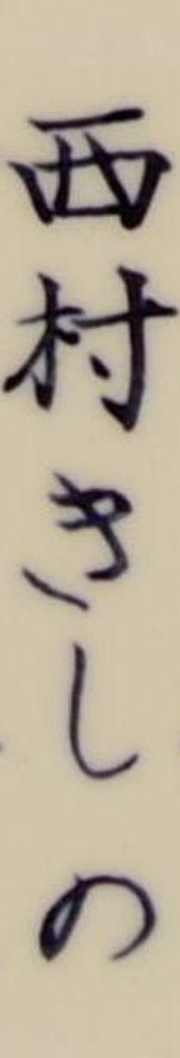西村きしの
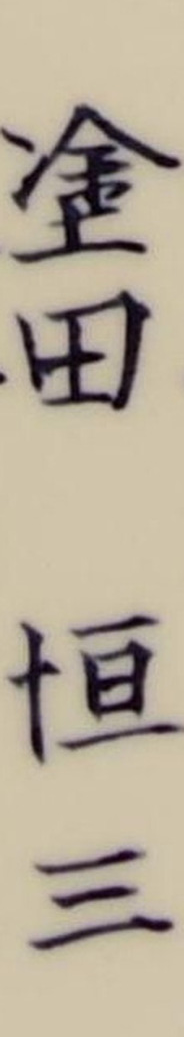塗田恒三
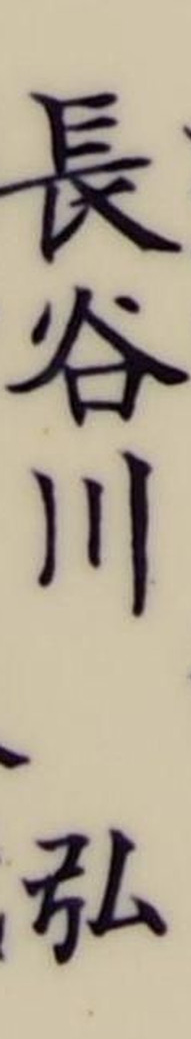長谷川弘
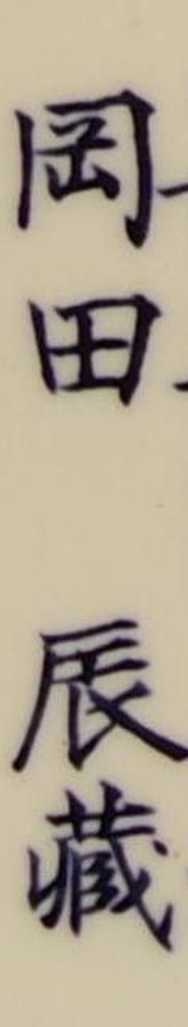岡田辰蔵
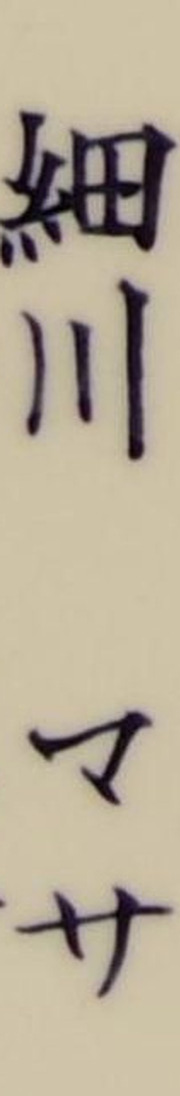細川マサ
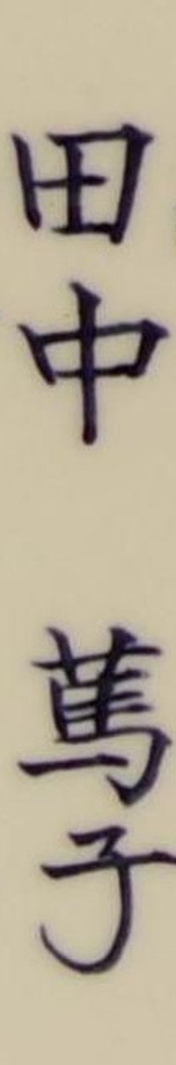田中篤子
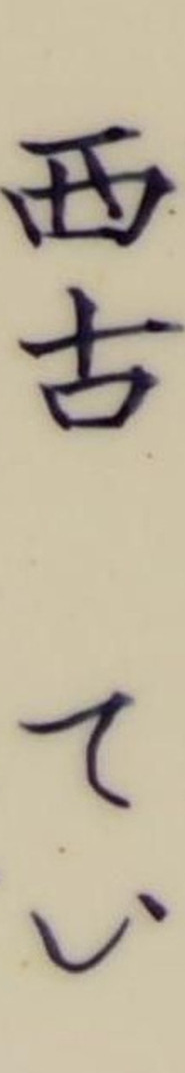西古てい
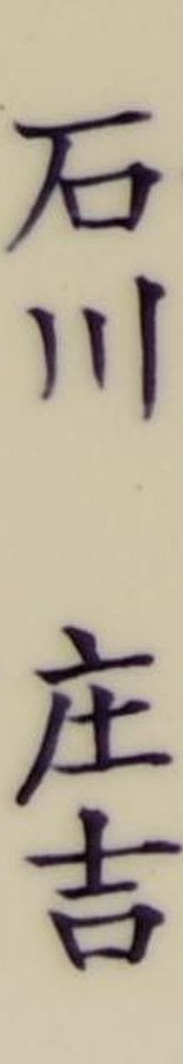石川庄吉
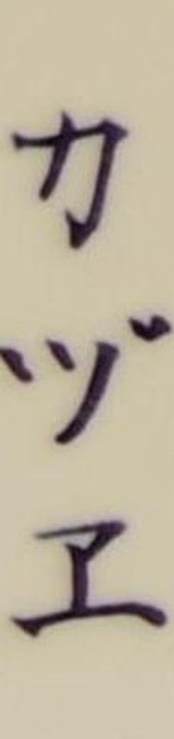カヅヱ
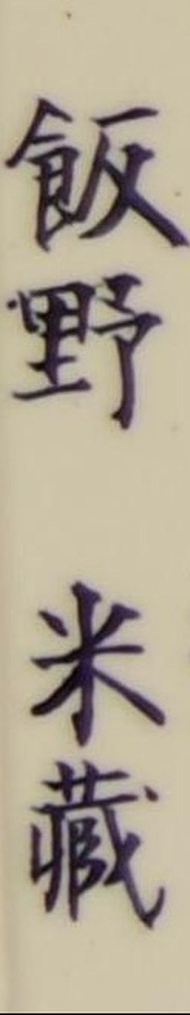飯野米蔵

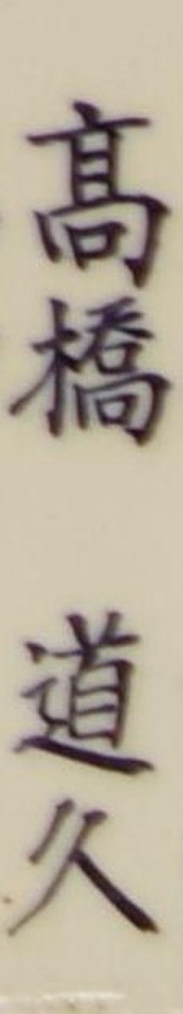高橋道久
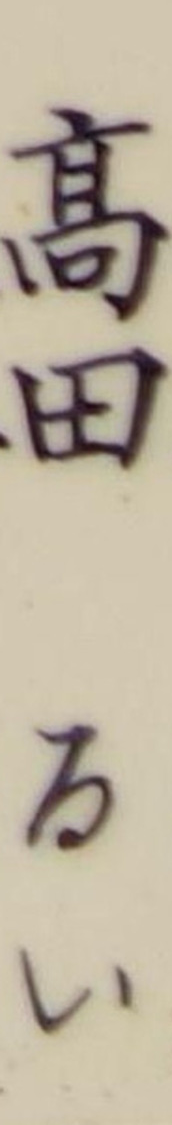高田るい
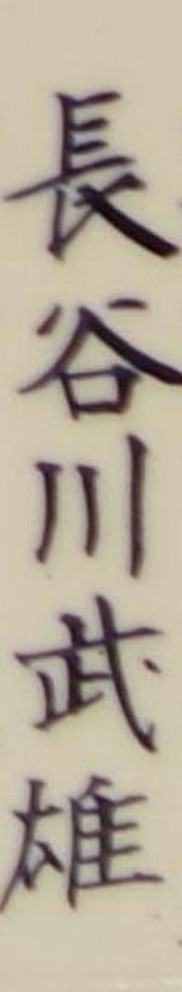長谷川武雄
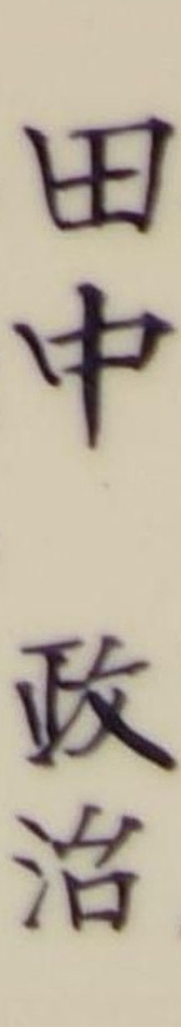田中政治
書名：E~L
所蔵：高野山金剛峯寺
